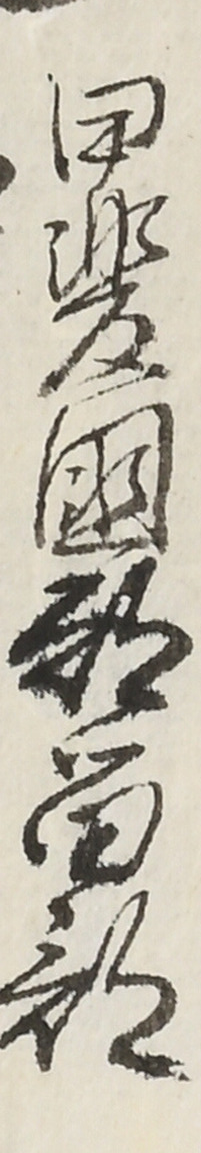甲斐国都留郡
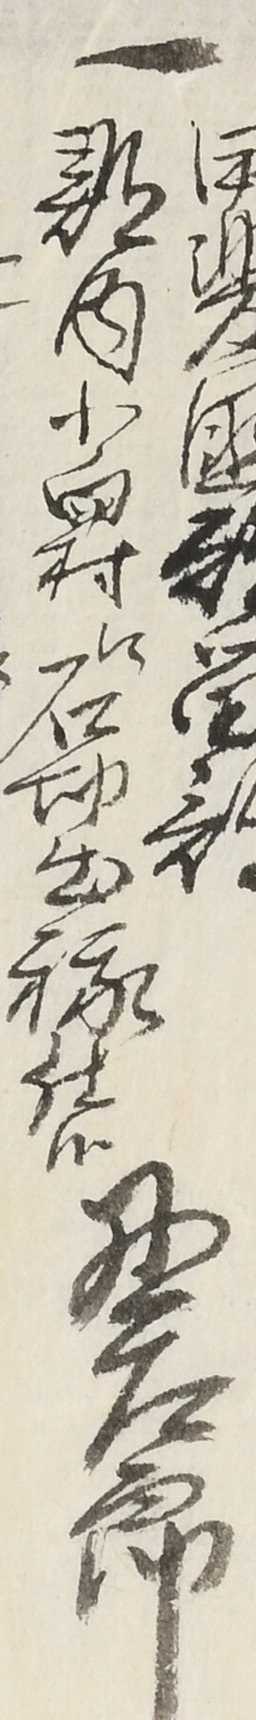一郡内小向村え石切出稼仕候丑太郎
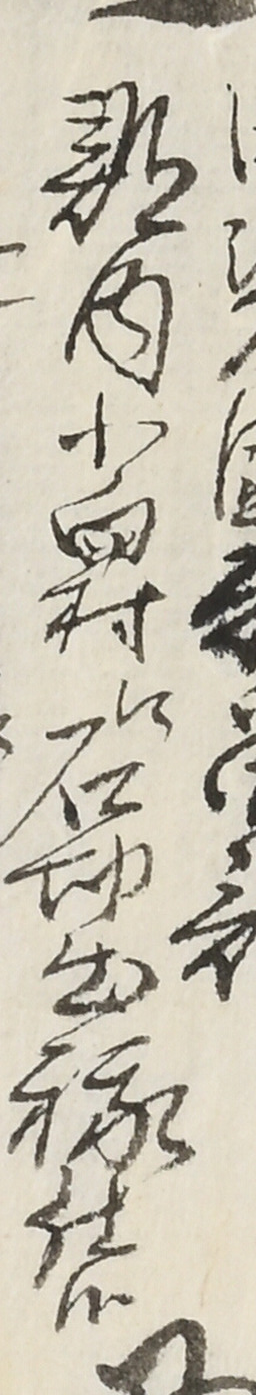一郡内小向村え石切出稼仕候
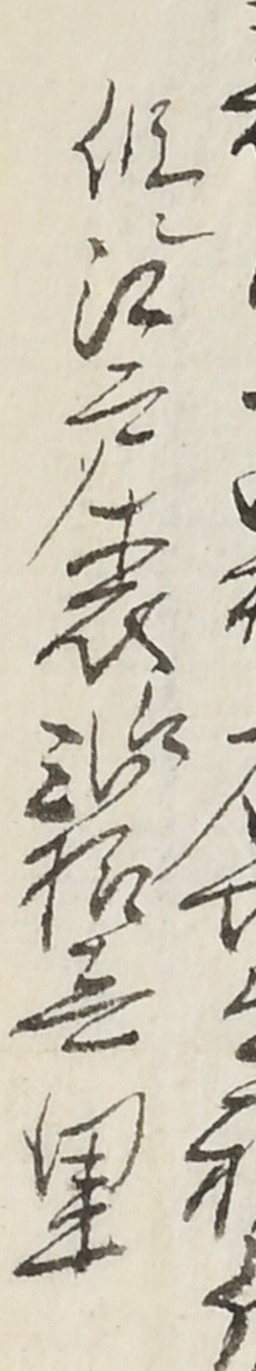但し江戸表え弐拾壱里
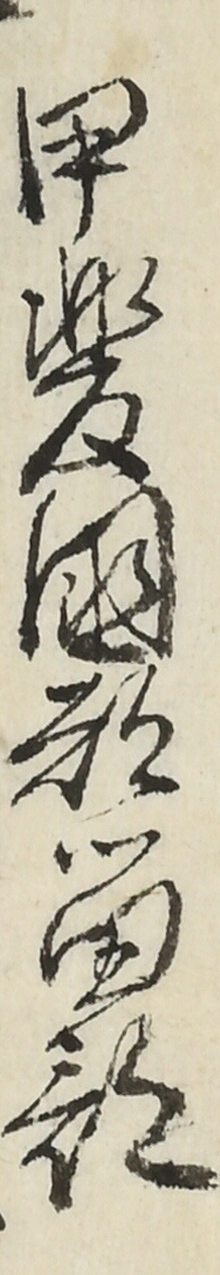甲斐国都留郡
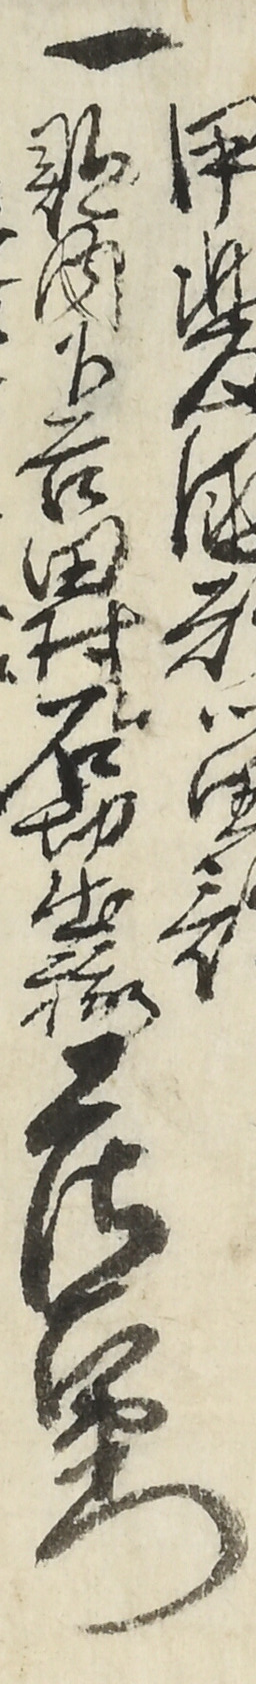一郡内下谷田村え石切出稼庄右衛門
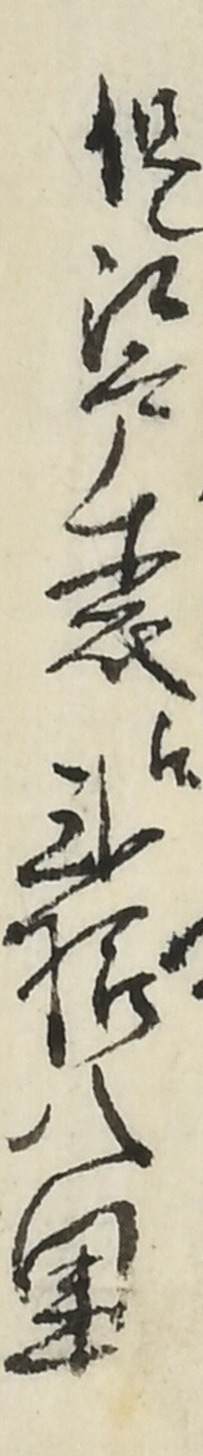但し江戸表え弐拾八里
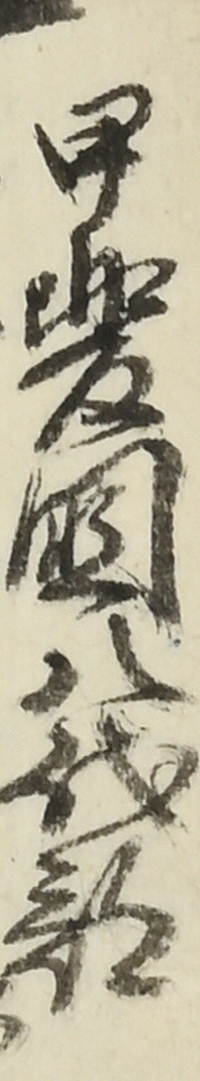甲斐国八代郡
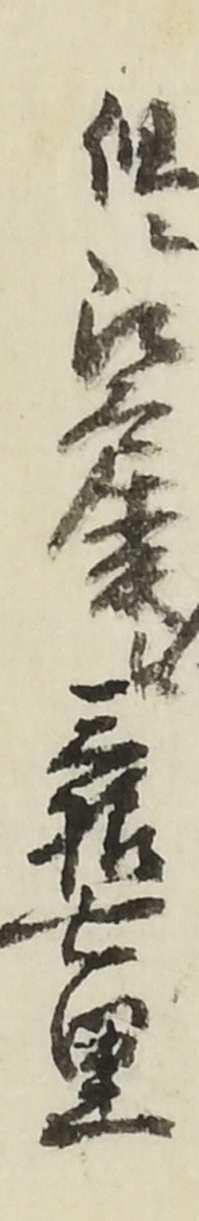但し江戸表え三拾七里
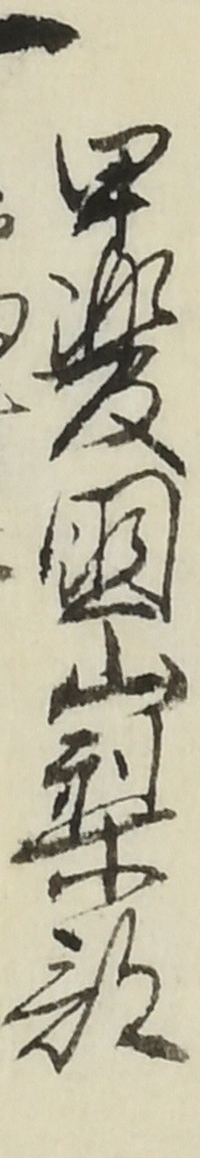甲斐国山梨郡
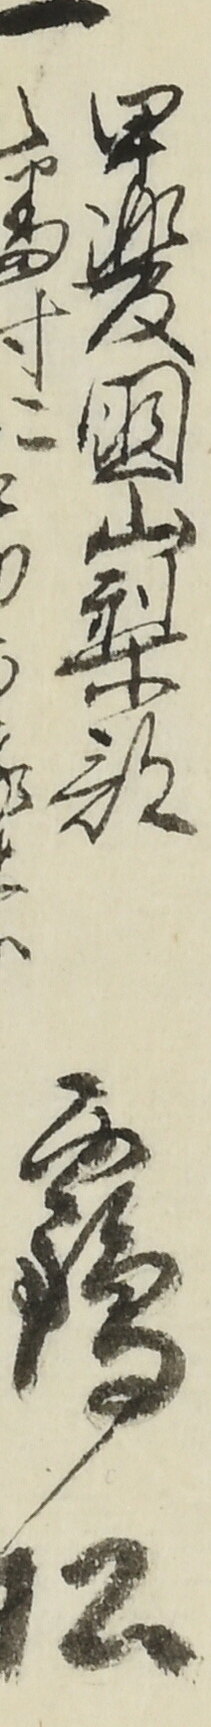甲斐国山梨郡鶴松
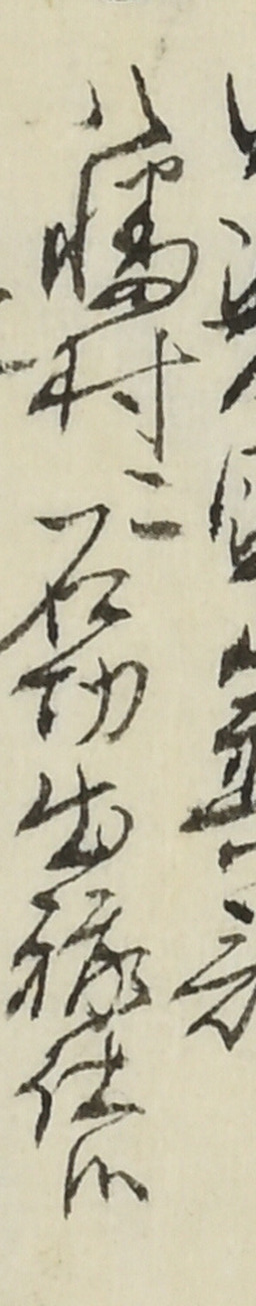一八幡村ニ石切出稼仕候
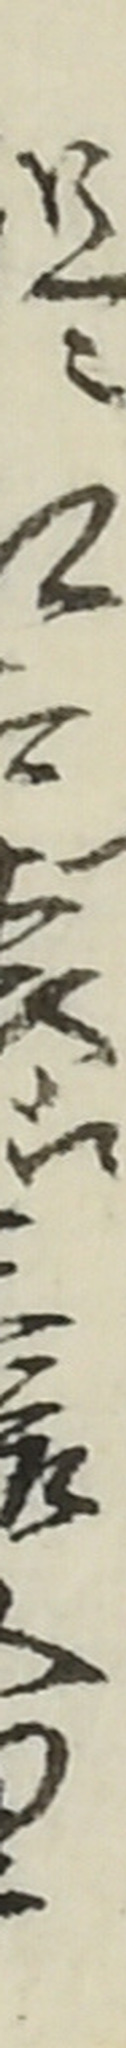但し江戸表え三拾五里

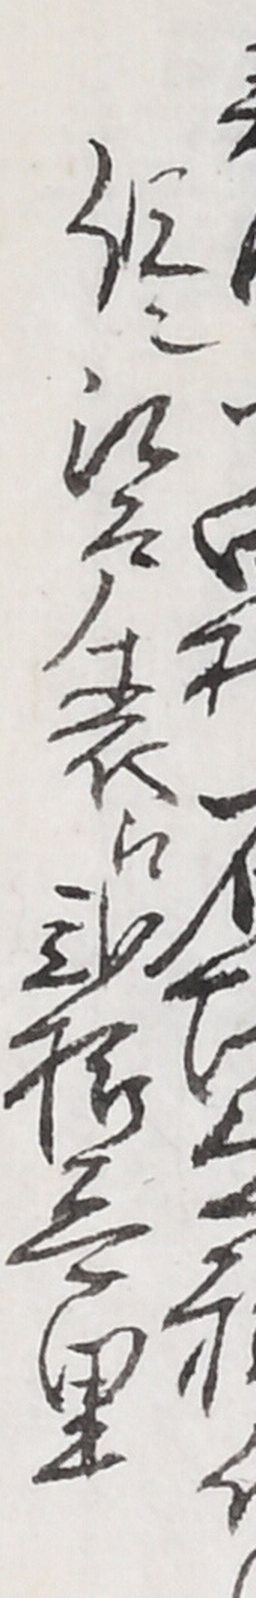但し江戸表え弐拾四里
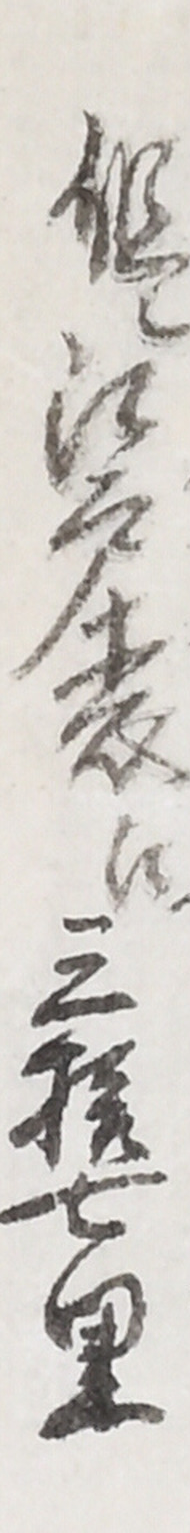但し江戸表え三拾五里
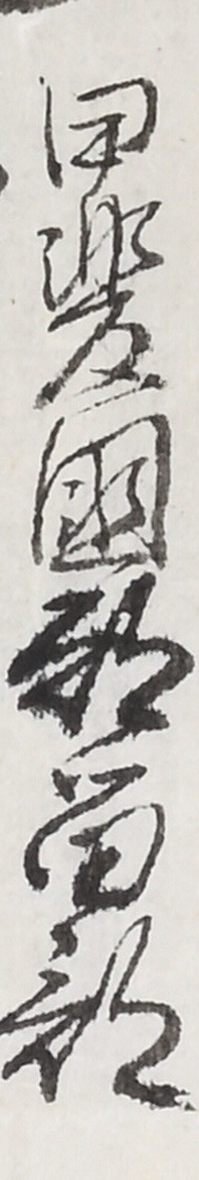甲斐国都留郡
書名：嘉永五壬子年正月江戸近國石切出稼名前書上帳
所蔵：伊那市立高遠町図書館・合同会社AMANE
